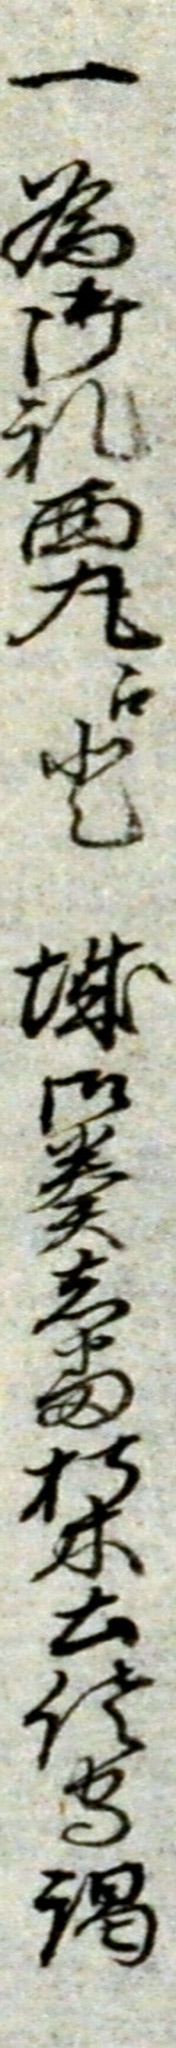一為御礼西丸江登城御奏者番朽木土佐守謁
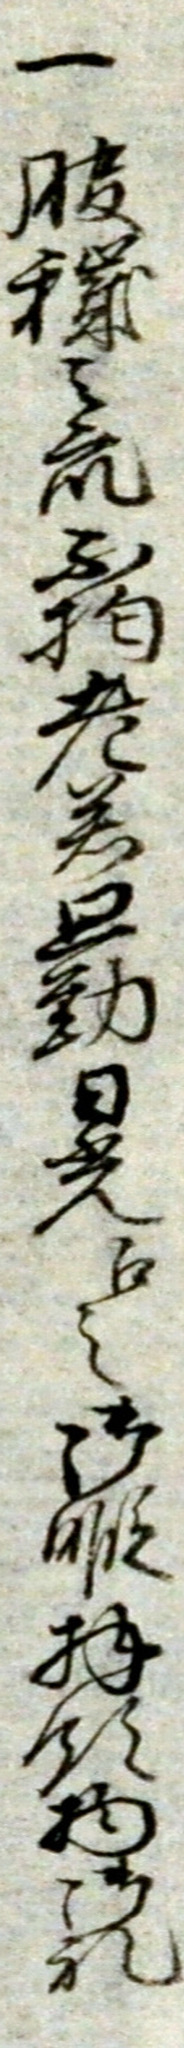一服穢之衆不拘老若廻勤日光江之御暇拝領物御礼
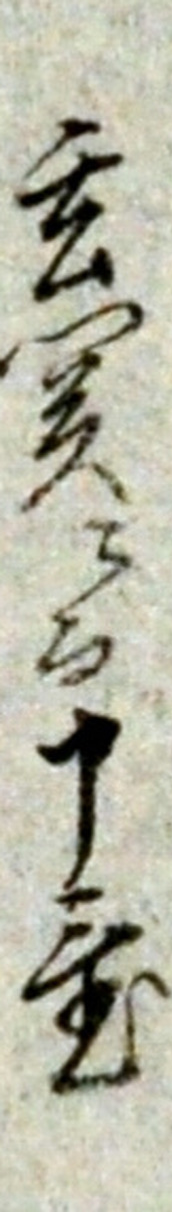玄関二而申置
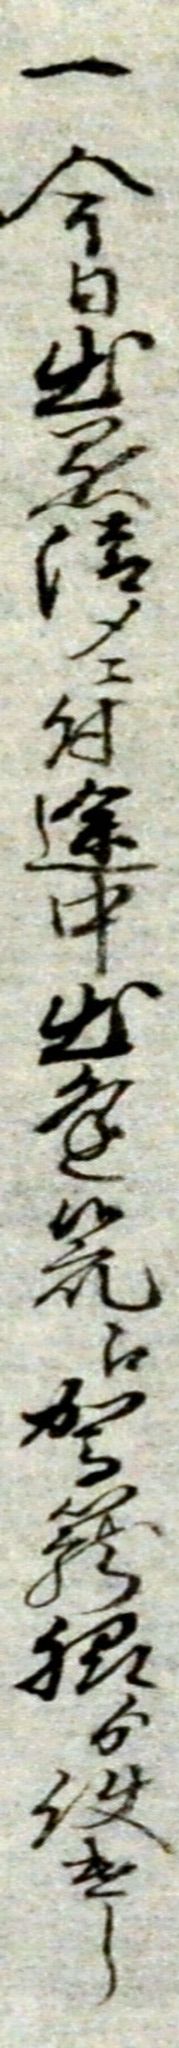一今日出懸清メ二付途中出逢候衆江駕籠脇ゟ使遣し
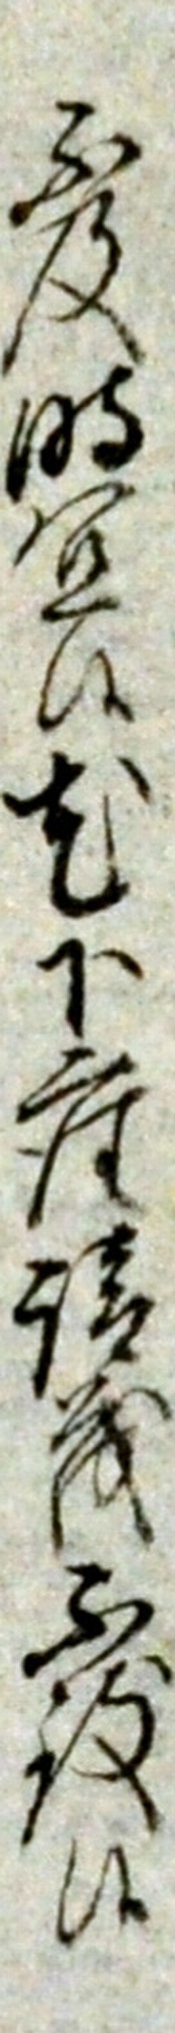不及時宜候尤下座請も不致候
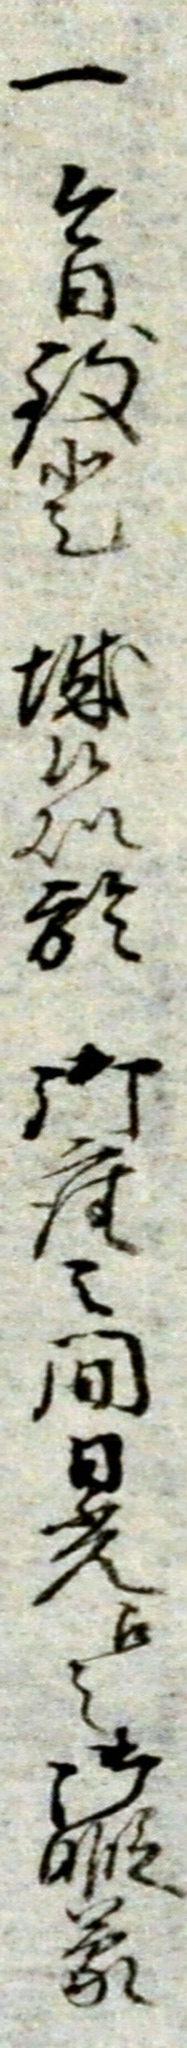一今日致登城候処於御座之間日光江之御暇蒙
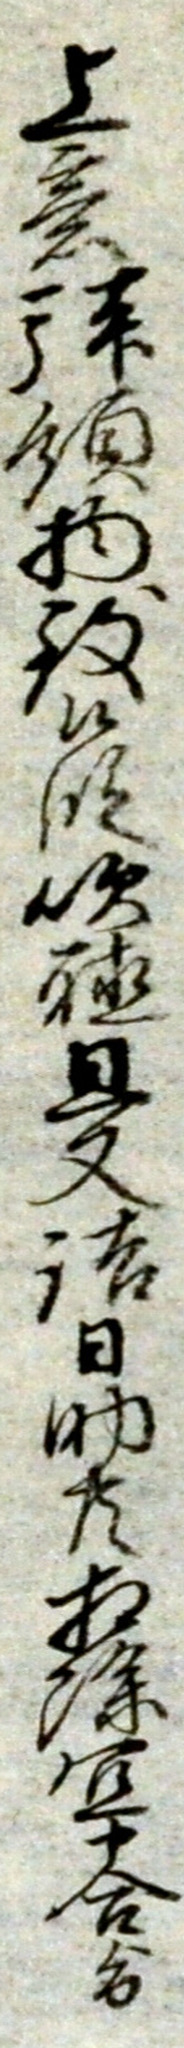上意拝領物致候段吹聴且又詰日助共相除宜申合旨
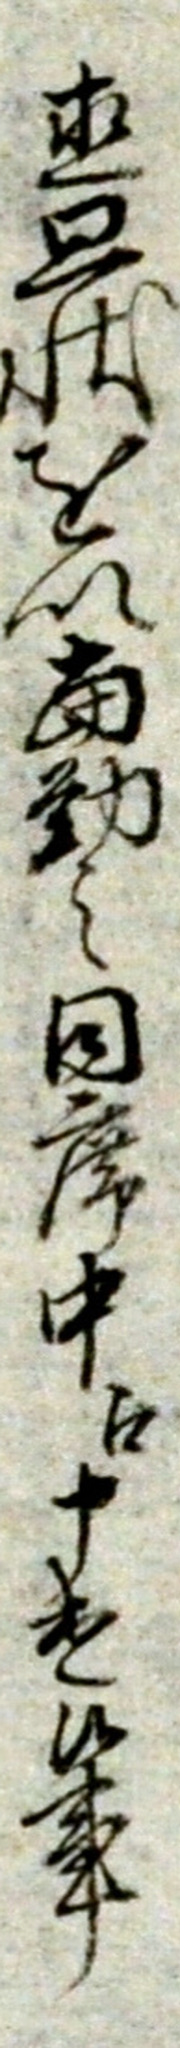直廻状を以當勤之同席中江申遣候事
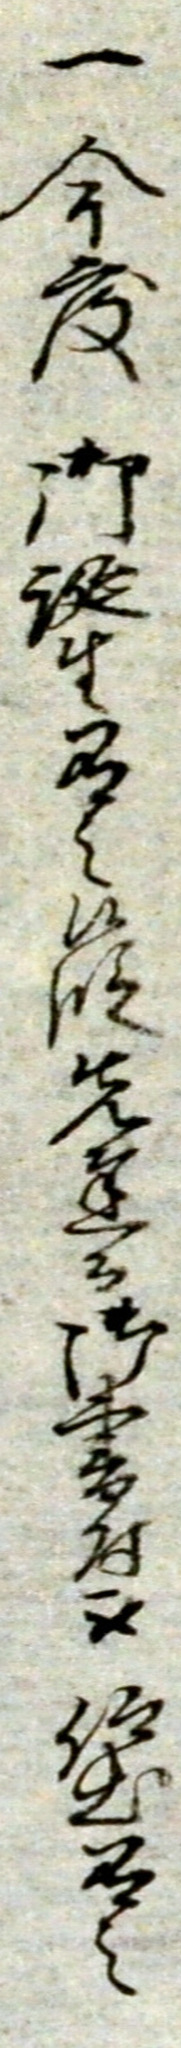一今度御誕生有之候段先達而御書付被仰出有之
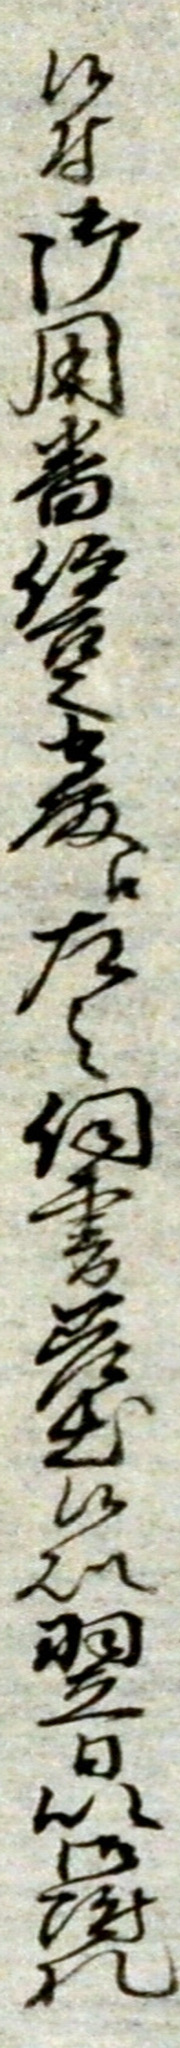候付御用番伊豆守殿江左之伺書差出候処翌日以御附札
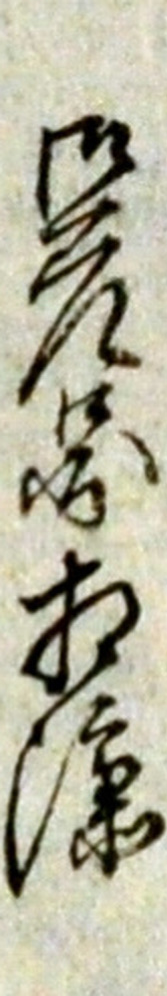御差図相済
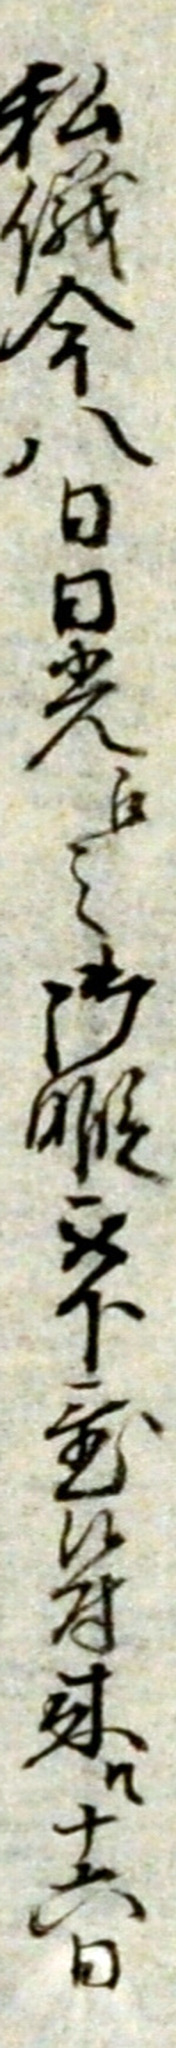私儀今八日日光江之御暇被下置候付來ㇽ十六日
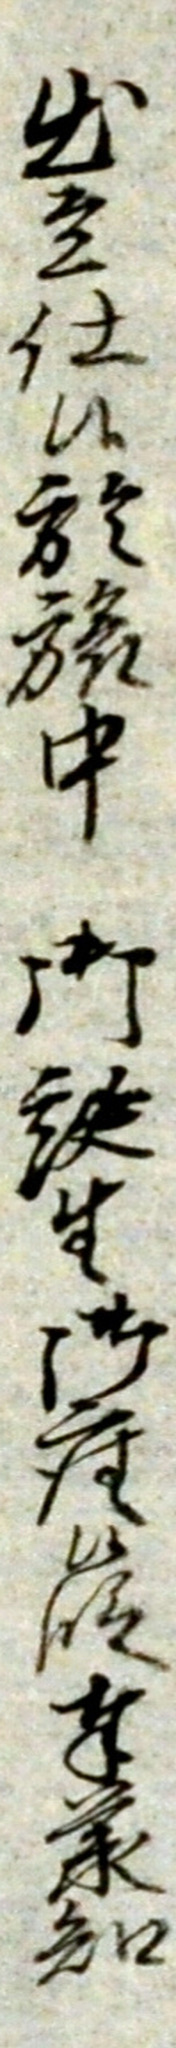出立仕候於旅中御誕生御座候段奉承知
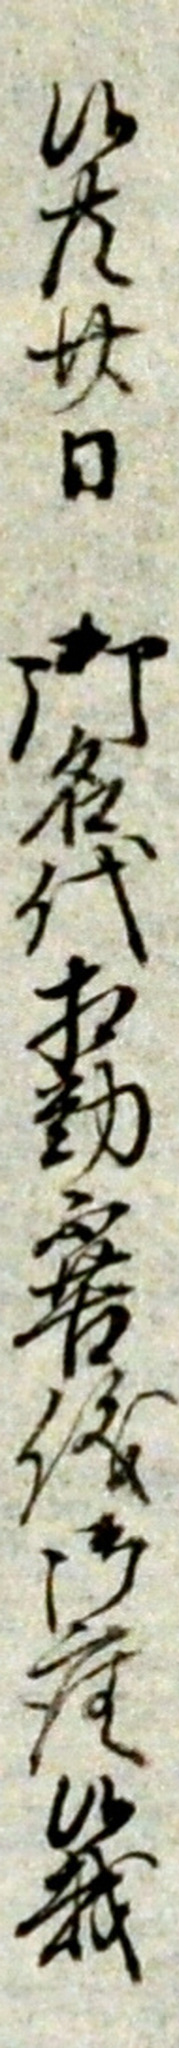候共廿日御名代相勤不苦儀御座候哉
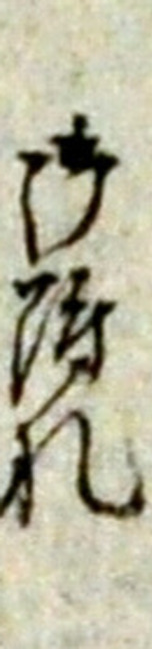御附札
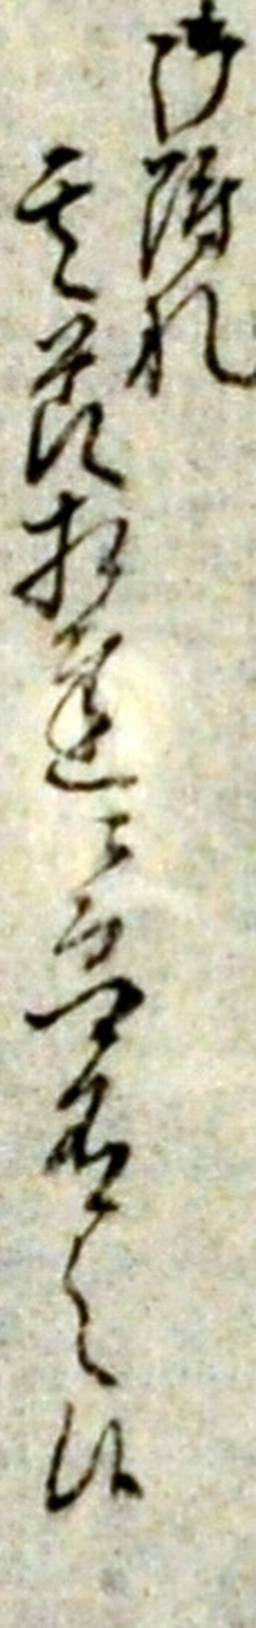其節相達二而可有之候
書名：日光御名代相勤候節ノ留
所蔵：伊那市立高遠町図書館・合同会社AMANE
